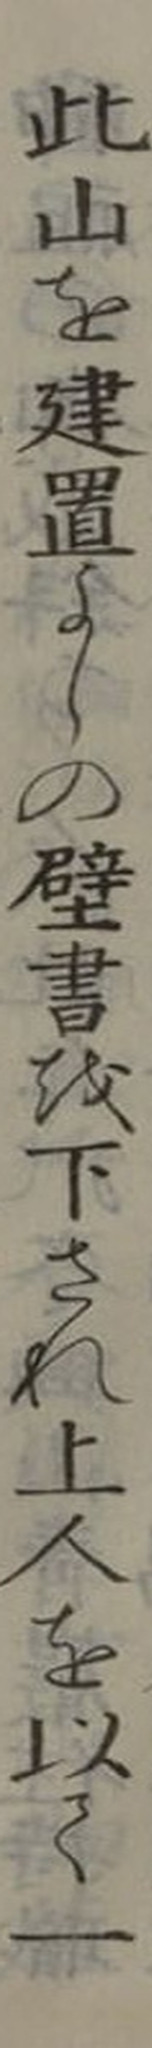此山を建置よしの壁書を下され上人を以て一
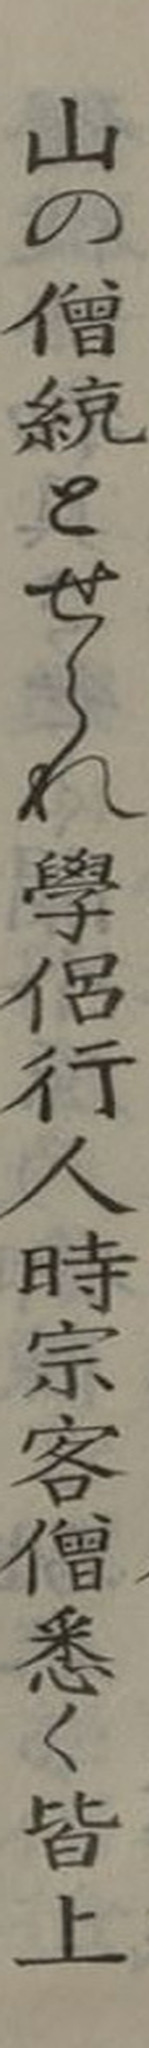山の僧綂とせられ學侶行人時宗客僧悉く皆上
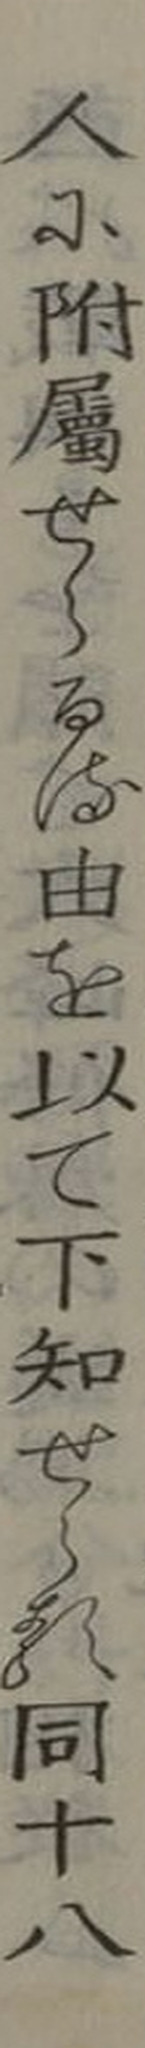人に附屬せらるる由を以て下知せらる同十八
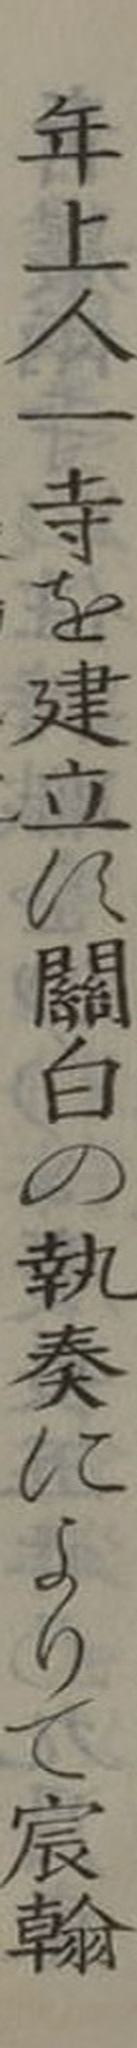年上人一寺を建立す關白の執奏によりて宸翰
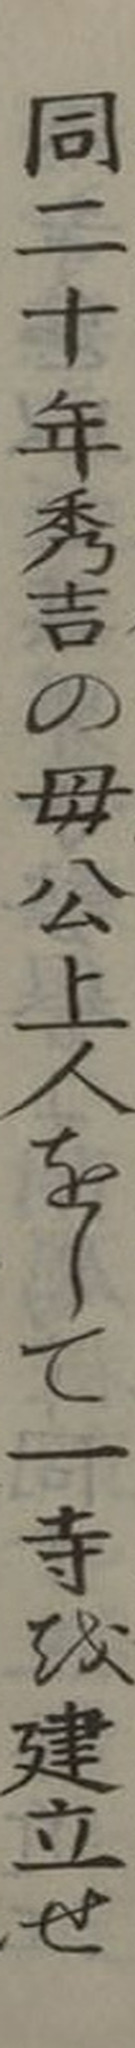同二十年秀吉の母公上人をして一寺を建立せ
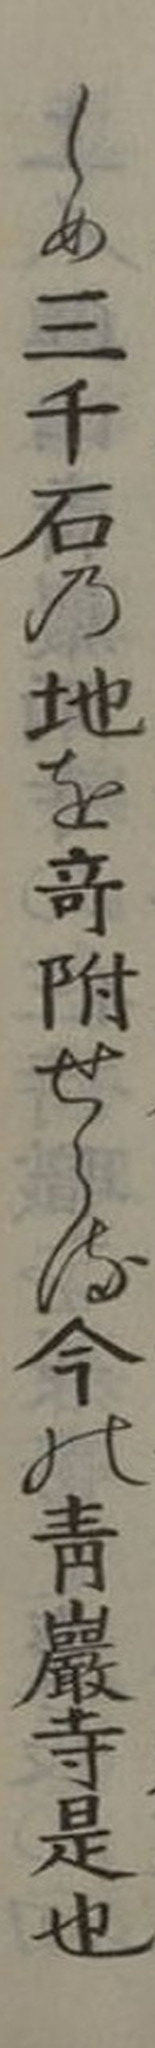しめ三千石の地を竒附せらる今の靑巖寺是也

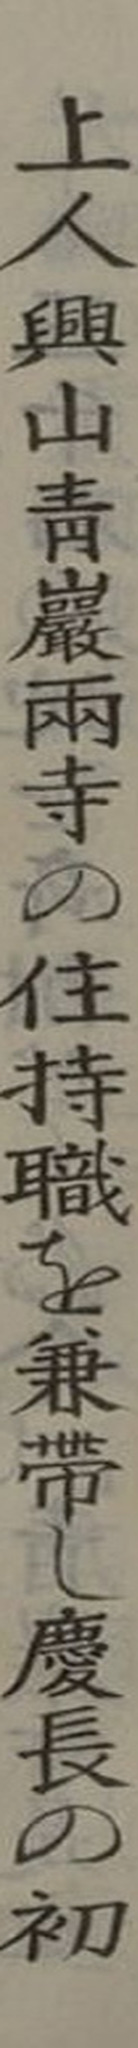上人興山靑嚴兩寺の住持職を兼帶し慶長の初
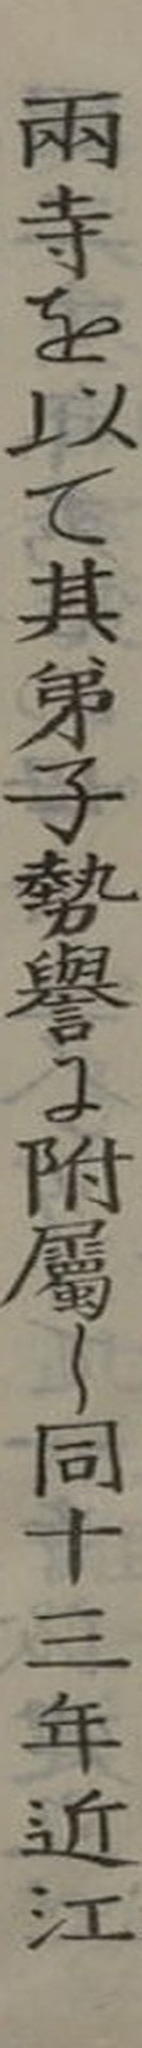兩寺を以て其弟子勢譽に附屬し同十三年近江
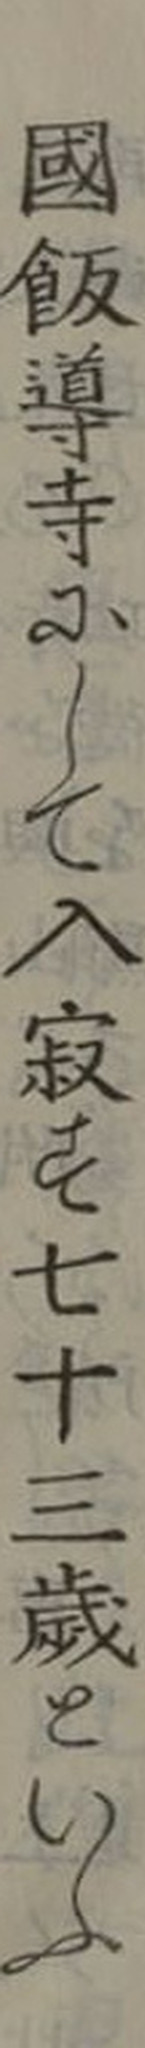國飯導寺にして入寂す七十三歳といふ
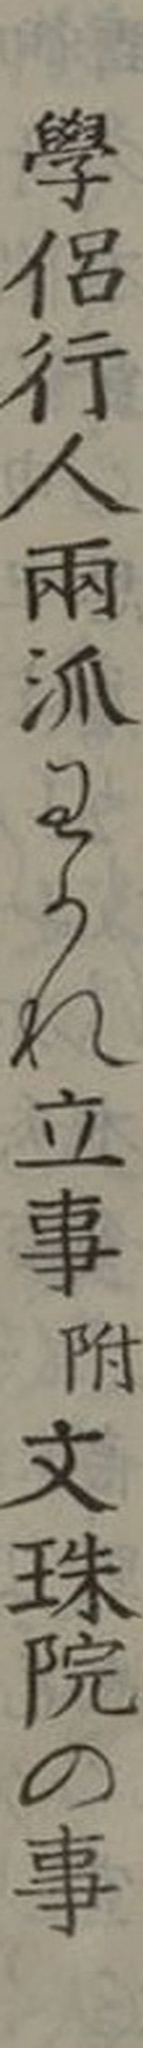學侶行人兩派わかれ立事附文珠院の事
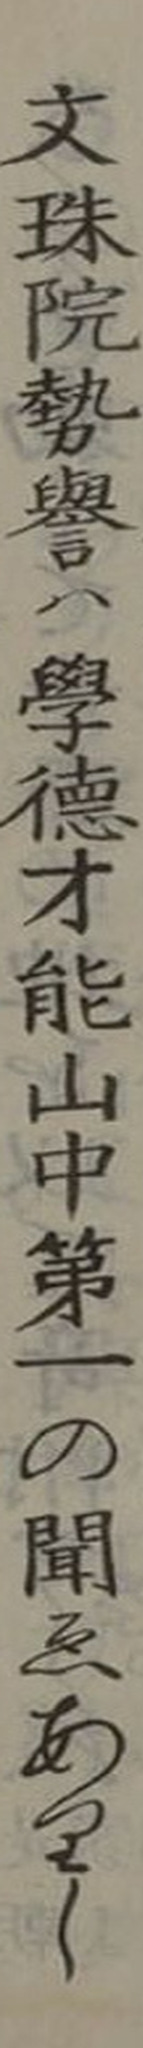文珠院勢譽は學德才能山中第一の聞ゑありし
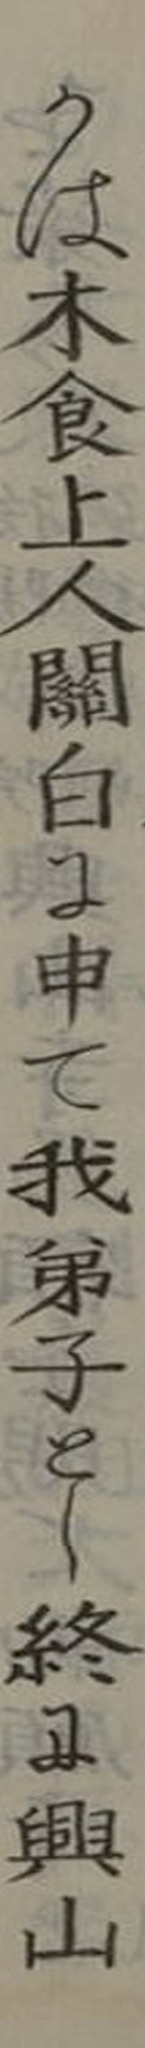かは木食上人關白に申て我弟子とし終に興山
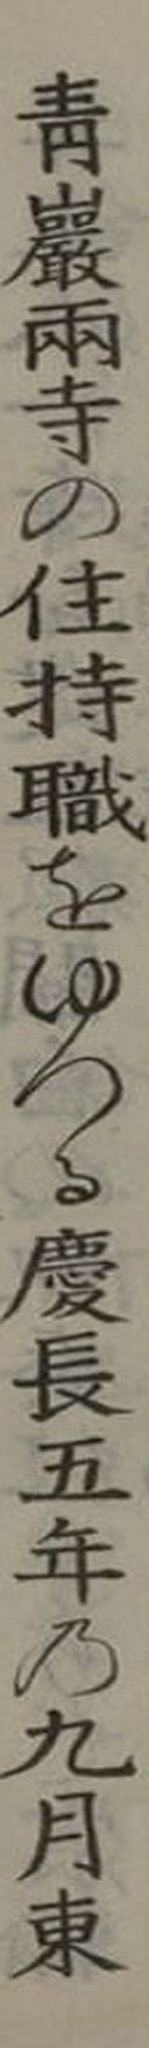靑嚴兩寺の住持職をゆつる慶長五年の九月東
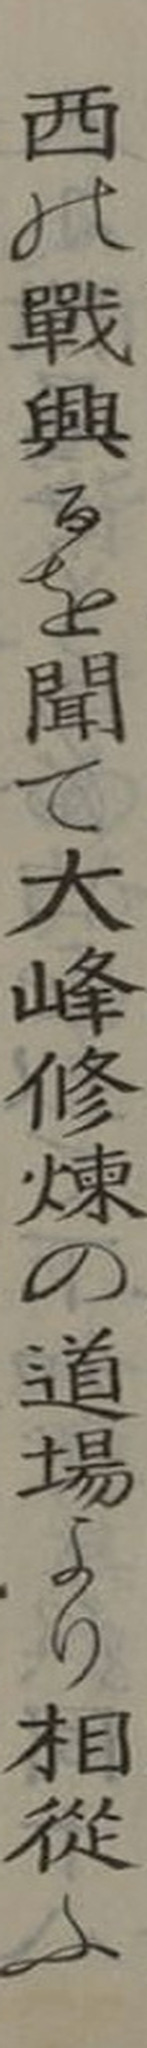西の戰興ると聞て大峰修煉の道場より相從ふ
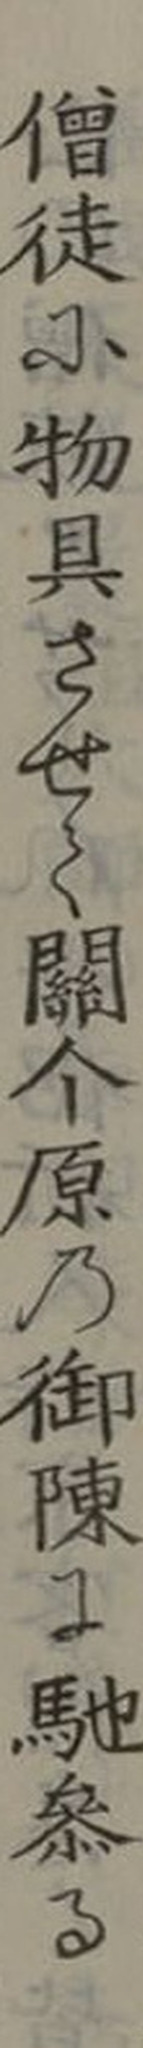僧徒に物具させて關个原の御陳に馳參る
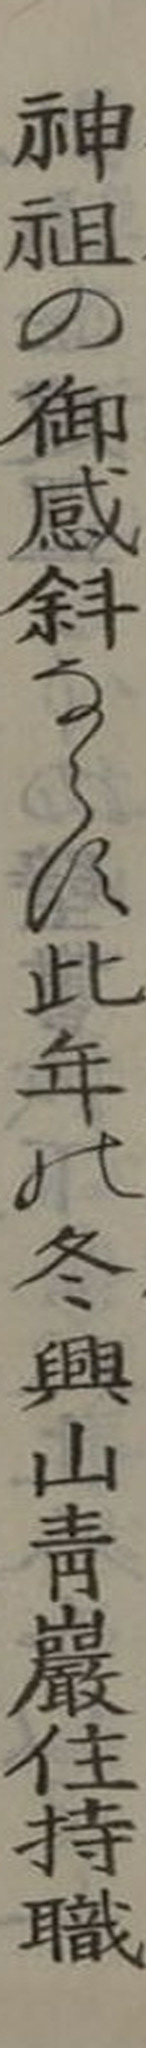神祖の御感斜ならす此年の冬興山靑嚴住持職
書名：骨董録
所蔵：University of the Ryukyus Library
